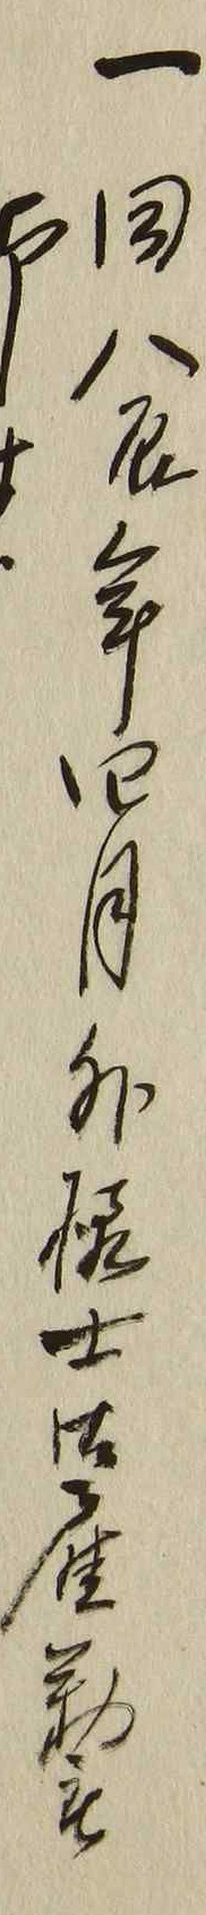一同八辰年四月外様士御雇勤被
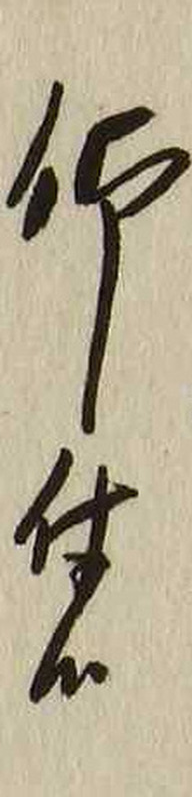仰付候
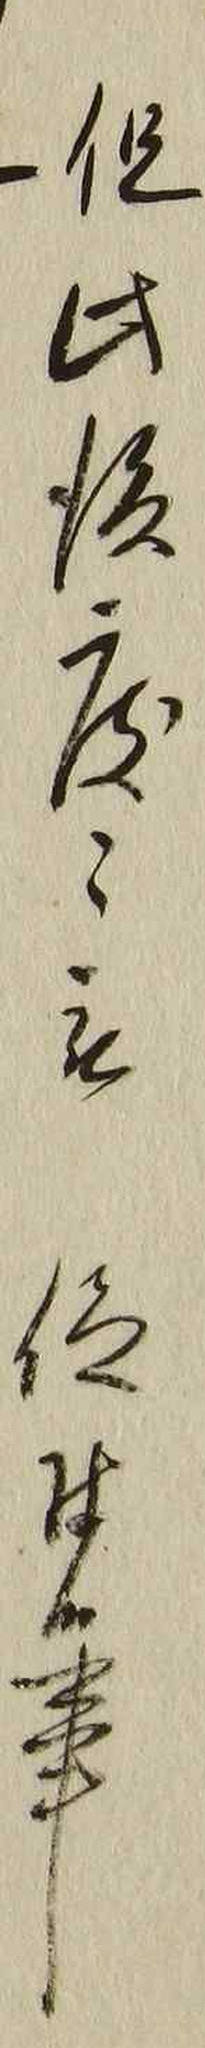但此後度々被仰付候事
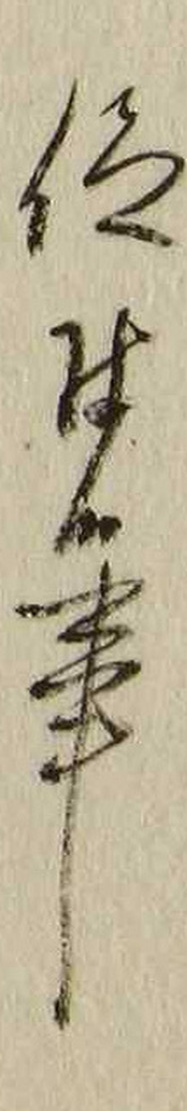仰付候事
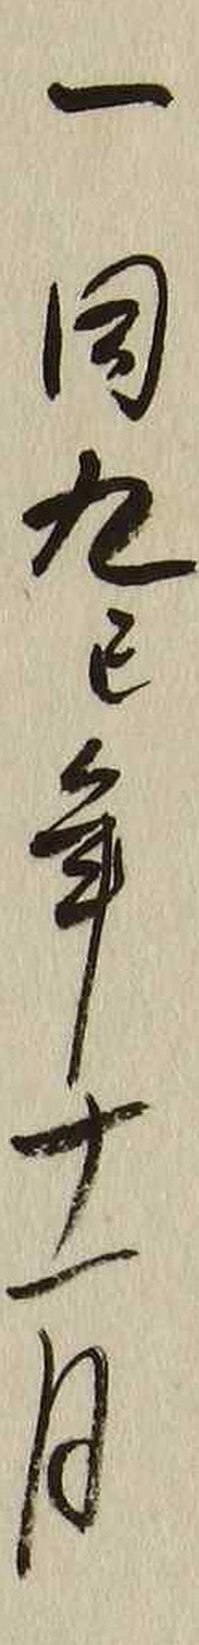一同九巳年十一月
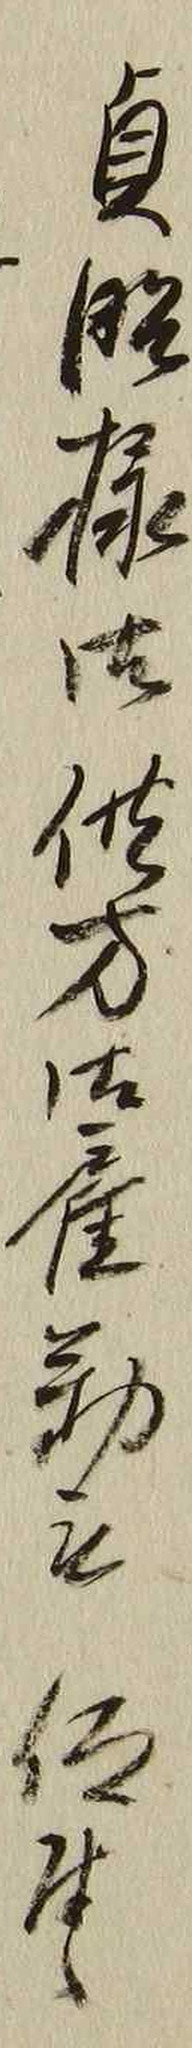貞昭様御供方御雇勤被仰付候
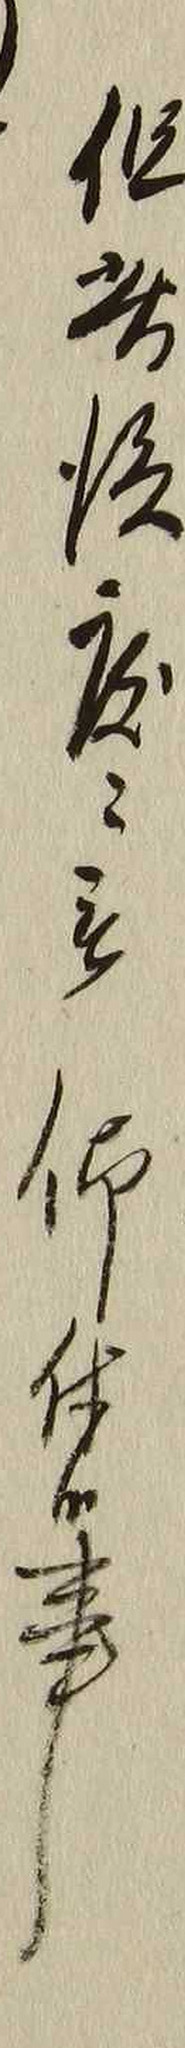但此後度々被仰付候事
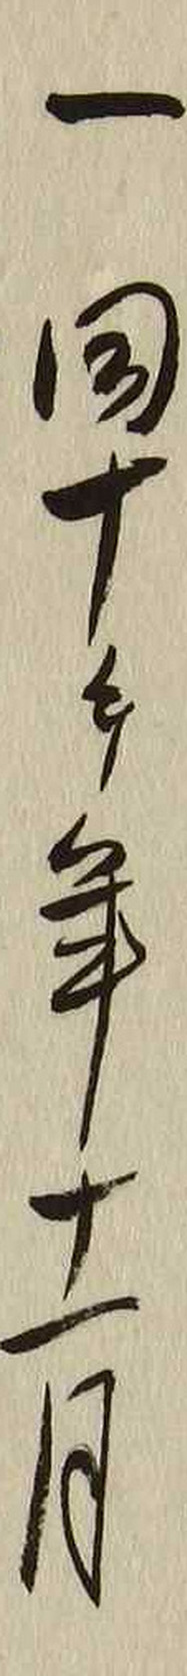一同十午年十一月
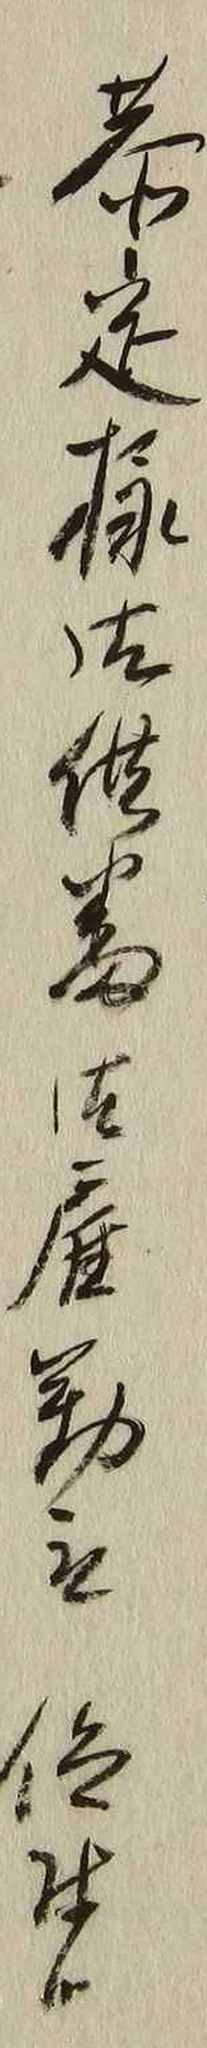恭定様御供番御雇勤被仰付候
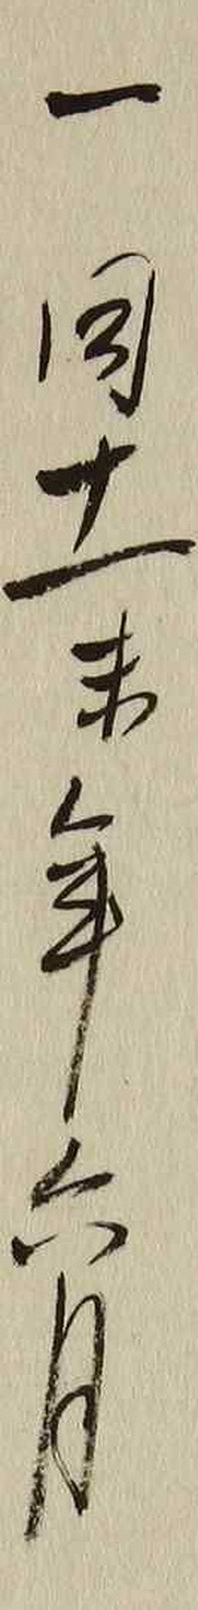一同十一未年六月
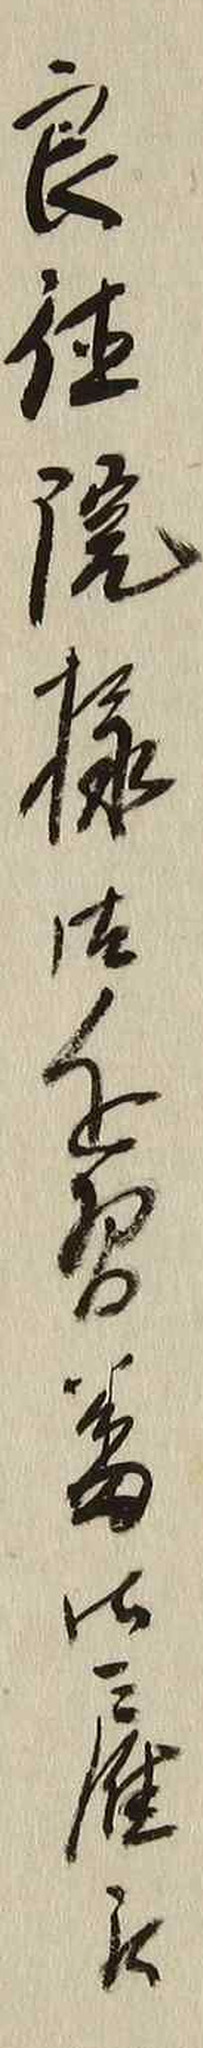良徳院様御近習番御雇被
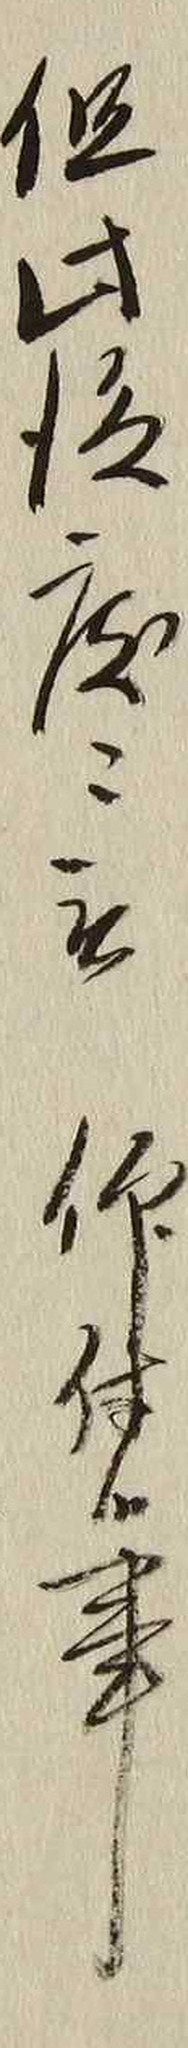但此後度々被仰付候事
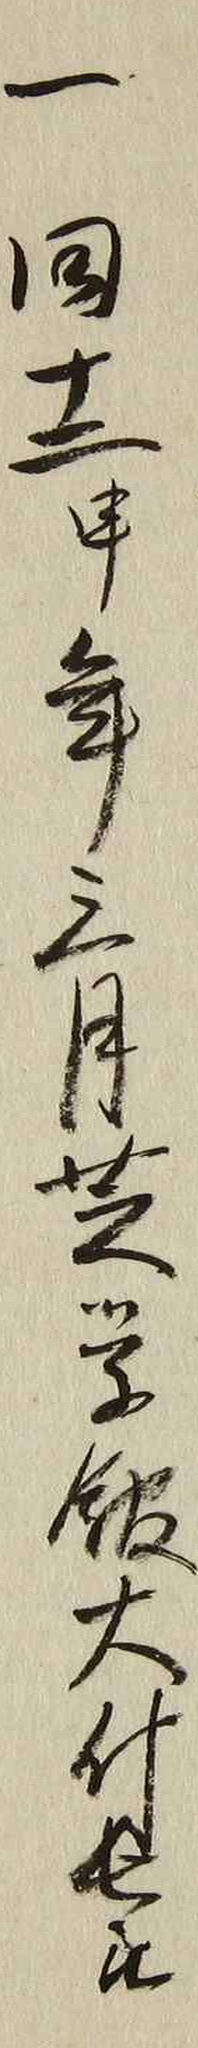一同十二申年三月芝学館大什長被
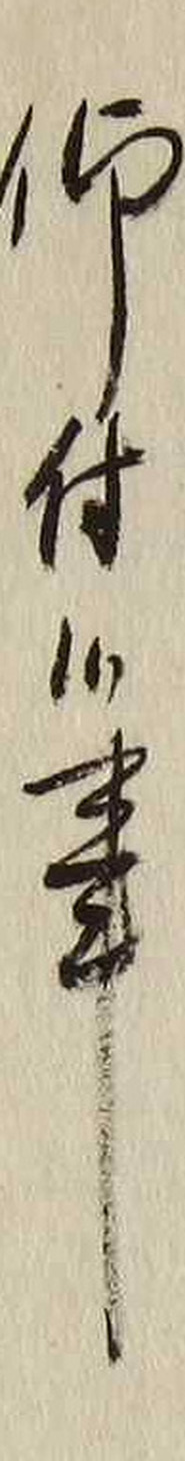仰付候事
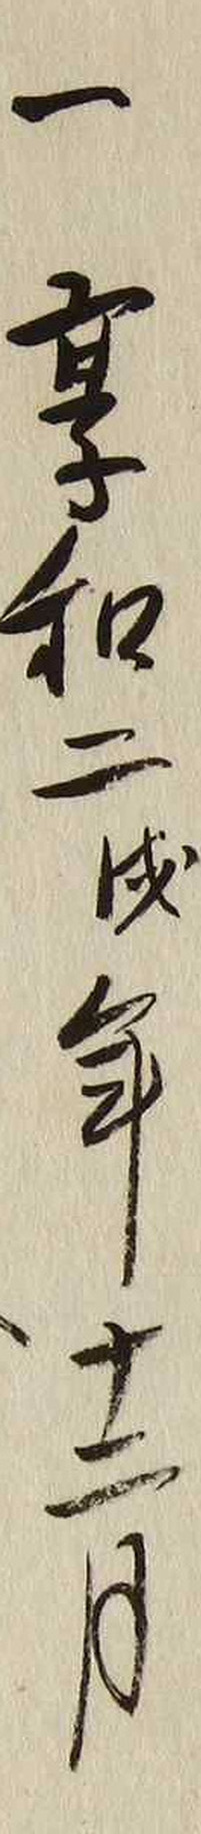一享和二戌年十二月
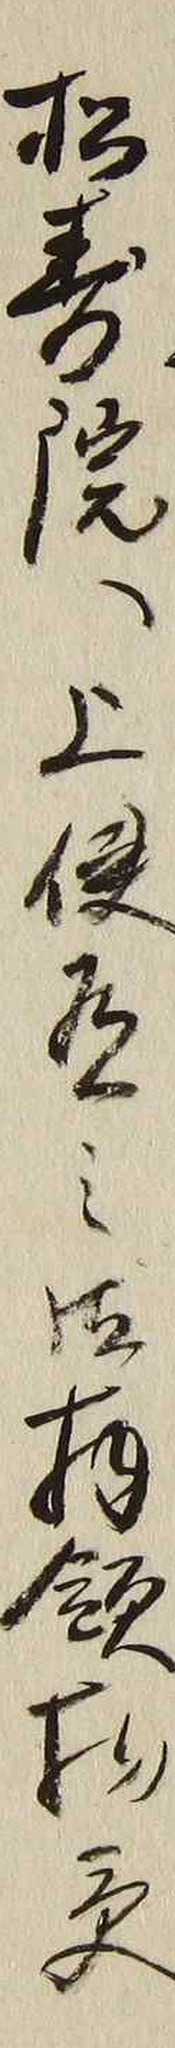松寿院へ上使有之御拝領物受
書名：諸士系譜　巻之349　も之部5
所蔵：会津若松市立会津図書館
